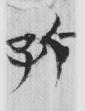孤
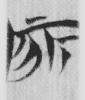所
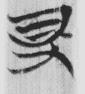𠭁
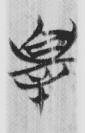辠
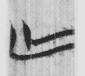亡
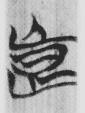良
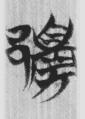{臱阝}
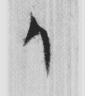人
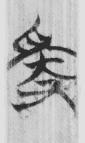爯
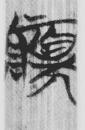{疒自犬}
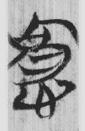{肙心}
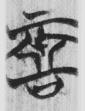{亞口}
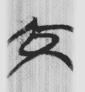交
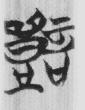{吅豆言}
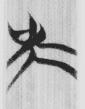吳
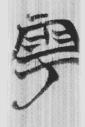𩁹
